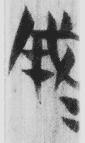成=
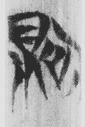則
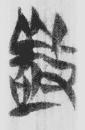敬
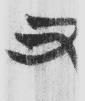又
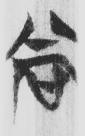尚
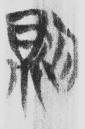則
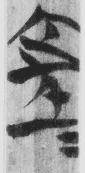{宀㞷}=
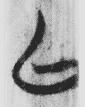㠯（以）
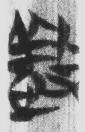敬
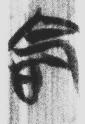命
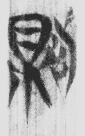則
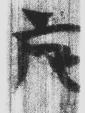厇
